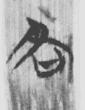各
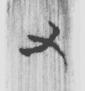又
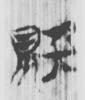{鳥巽}
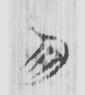勿
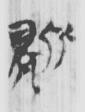{鳥比}
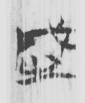{牛戊}
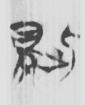{鳥此}
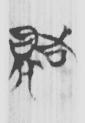{鳥厷}
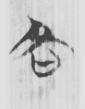各
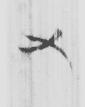又
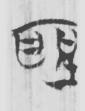聖
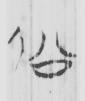伀
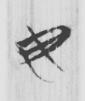母
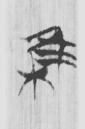集
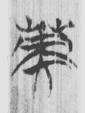英
